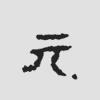亓（其）
